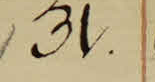31.
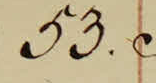53.
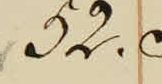52.
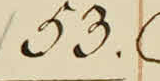53.
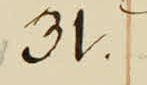31.
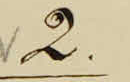2.
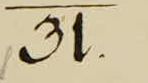31.
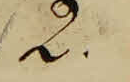2.
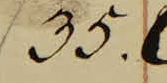35.
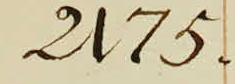2175
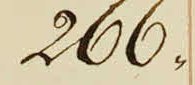266
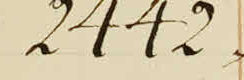2442
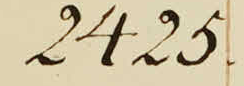2425
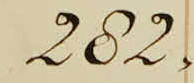282
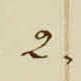2
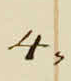4
